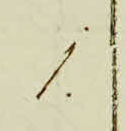1.
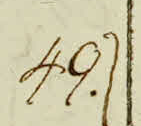49.
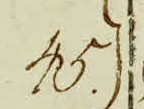45.
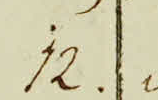12.
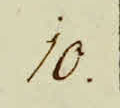10.
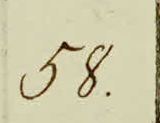58.
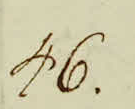46.
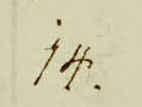14.
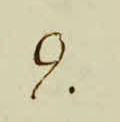9.
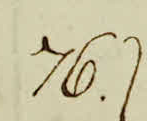76.
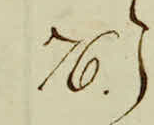76.
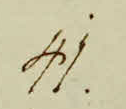41.
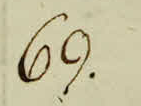69.
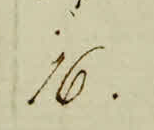16.
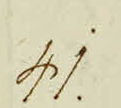41.
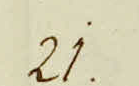21.
